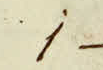1
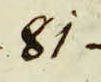81
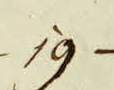19
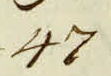47
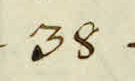38
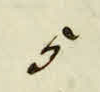5
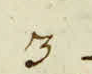3
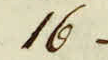16
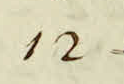12
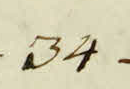34
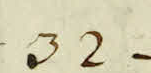32
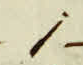1
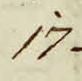17
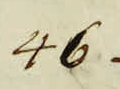46
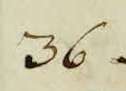36
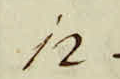12
